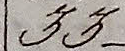33
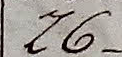26
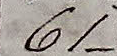61
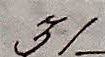31
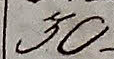30
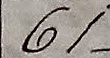61
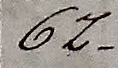62
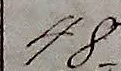48
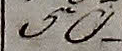50
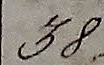38
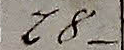28
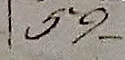59
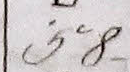58
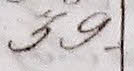39
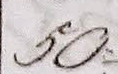50
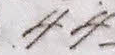44
